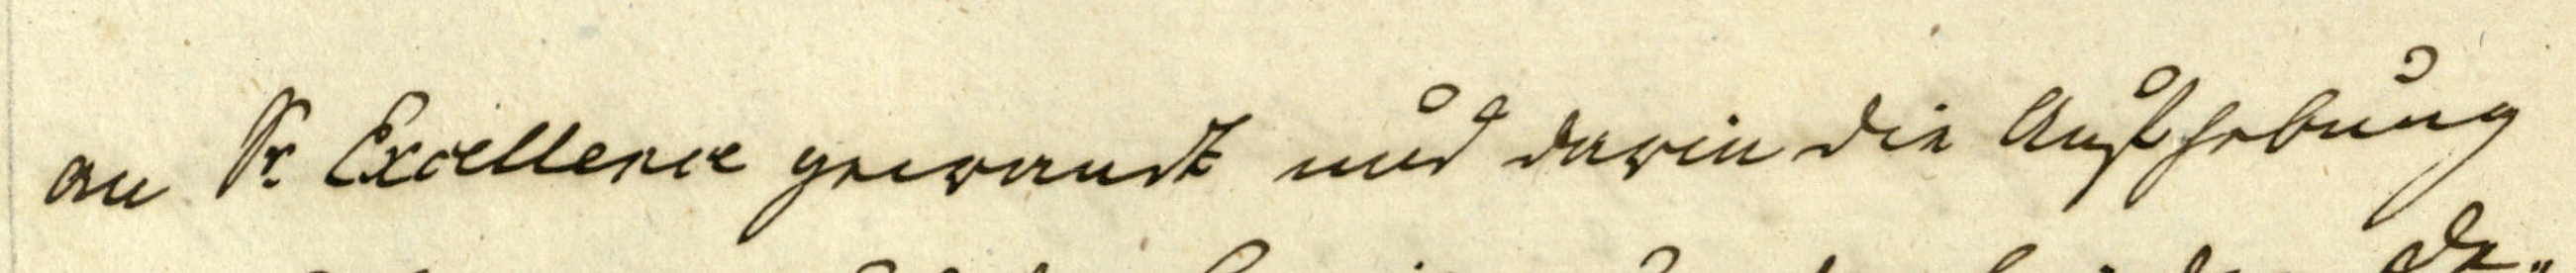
an Sr Excellence gewandt und darin die Aufhebung
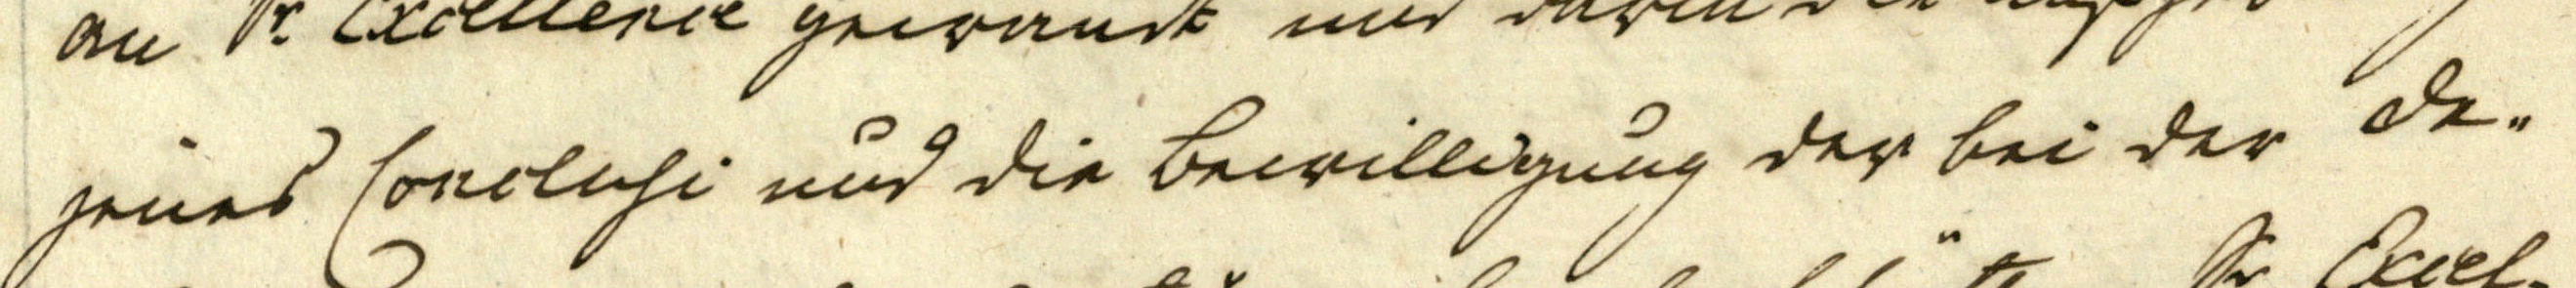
jenes Conclusi und die Bewilligung der bei der De¬
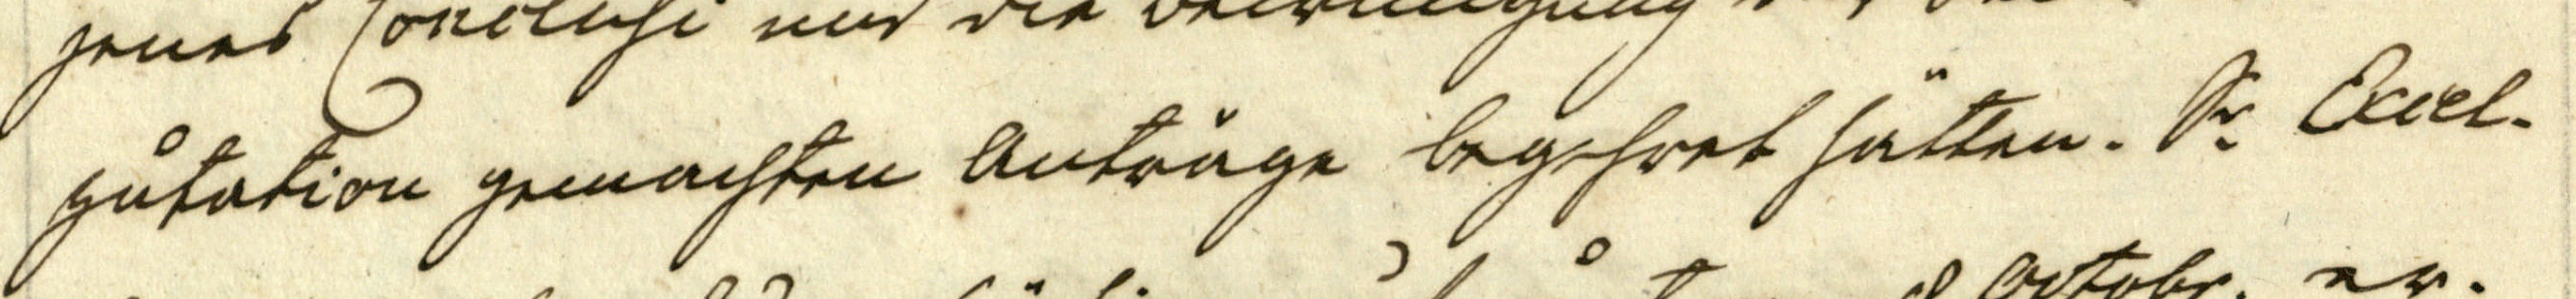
putation gemachten Anträge begehret hätten. Sr Excel¬
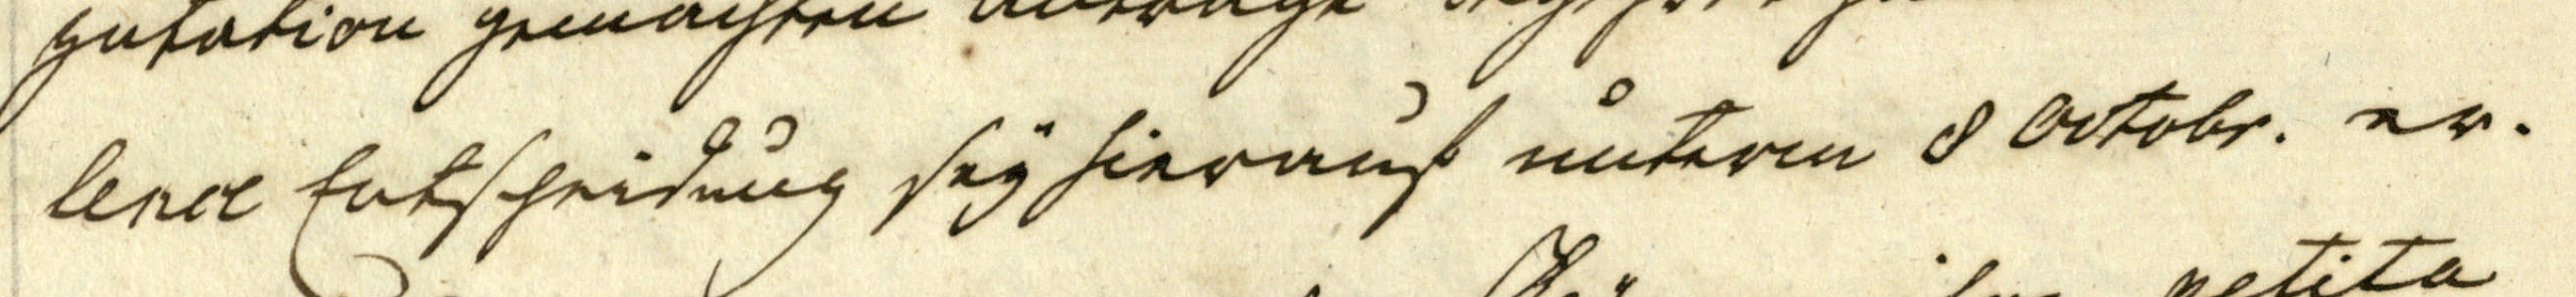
lence Entscheidung seÿ hierauf unterm 8. Octobr. er¬
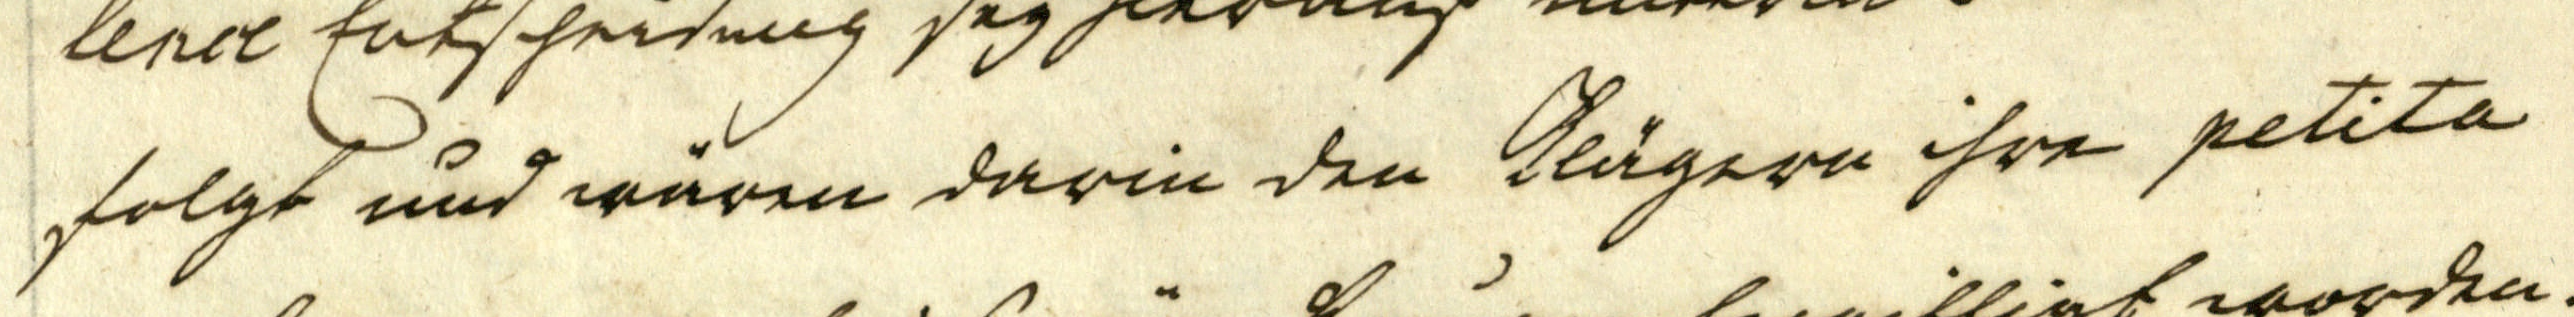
folgt und wären darin den Klägern ihre petita
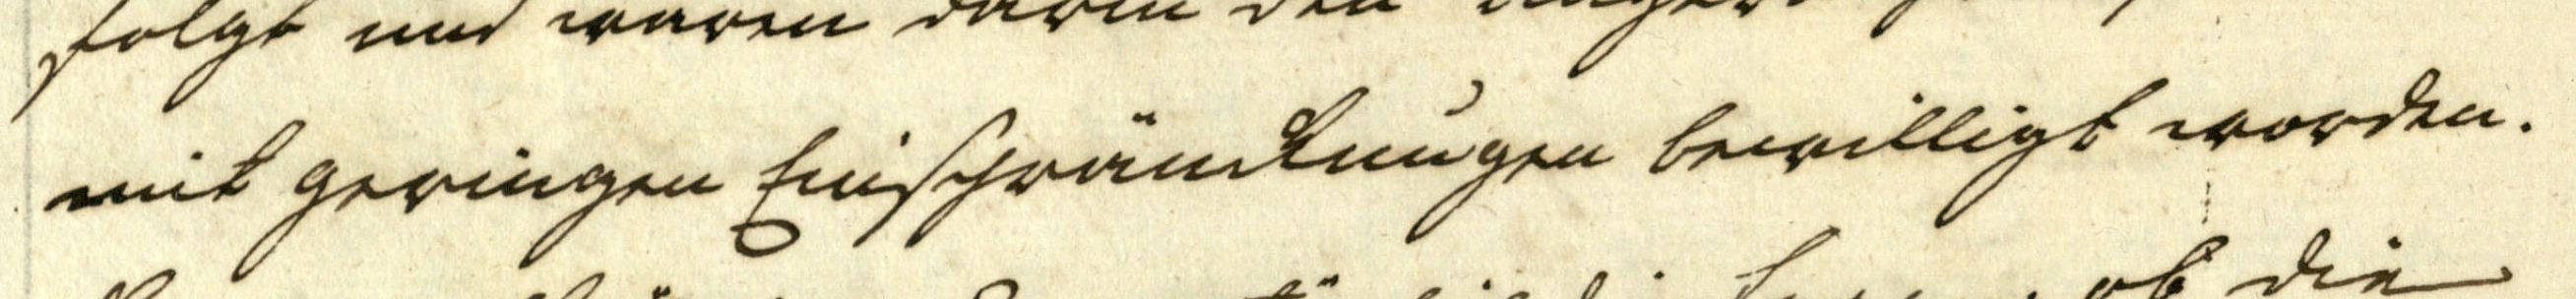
mit geringen Einschränckungen bewilligt worden.
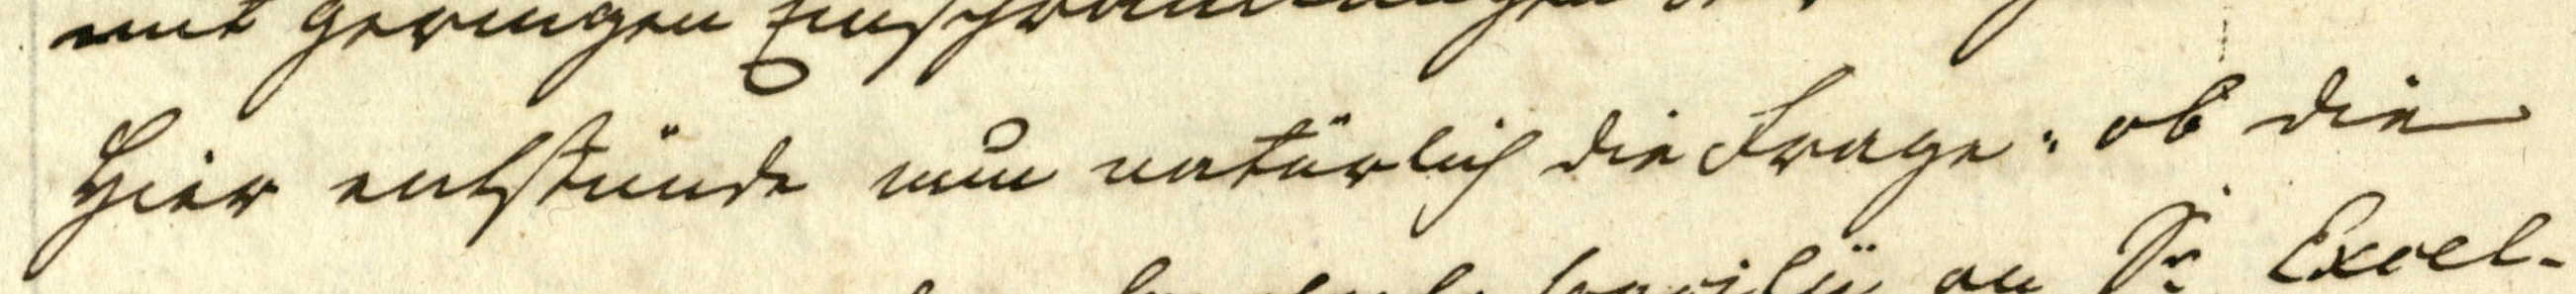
Hier entstünde nun natürlich die Frage: ob die
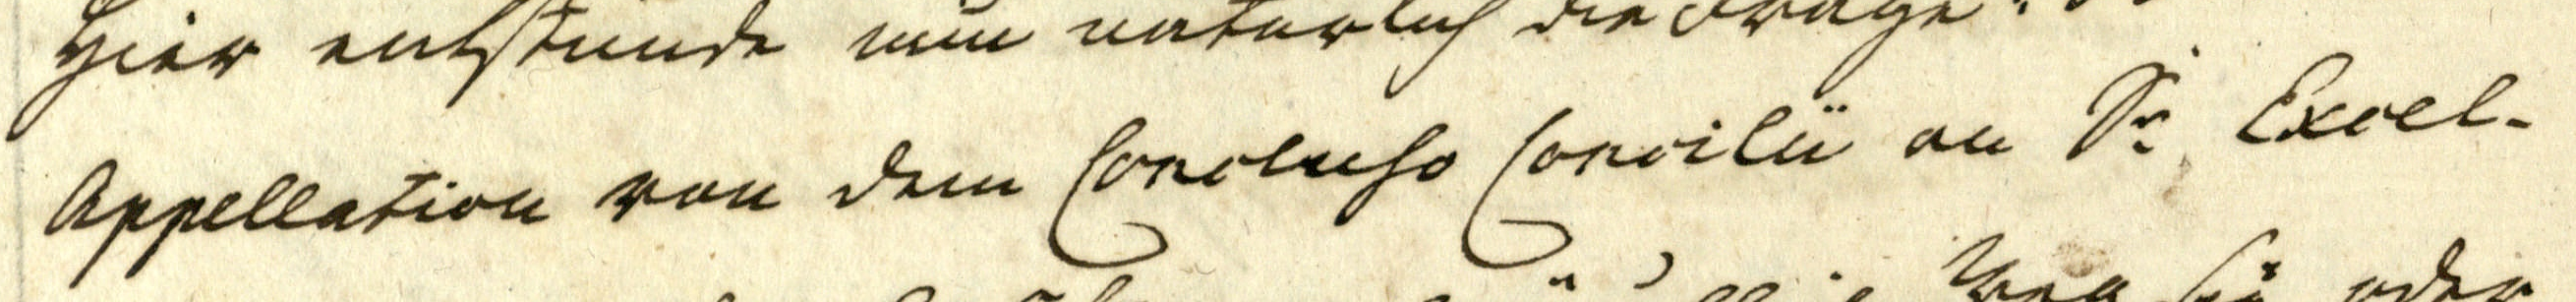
Appellation von dem Concluso Concilii an Sr Excel¬
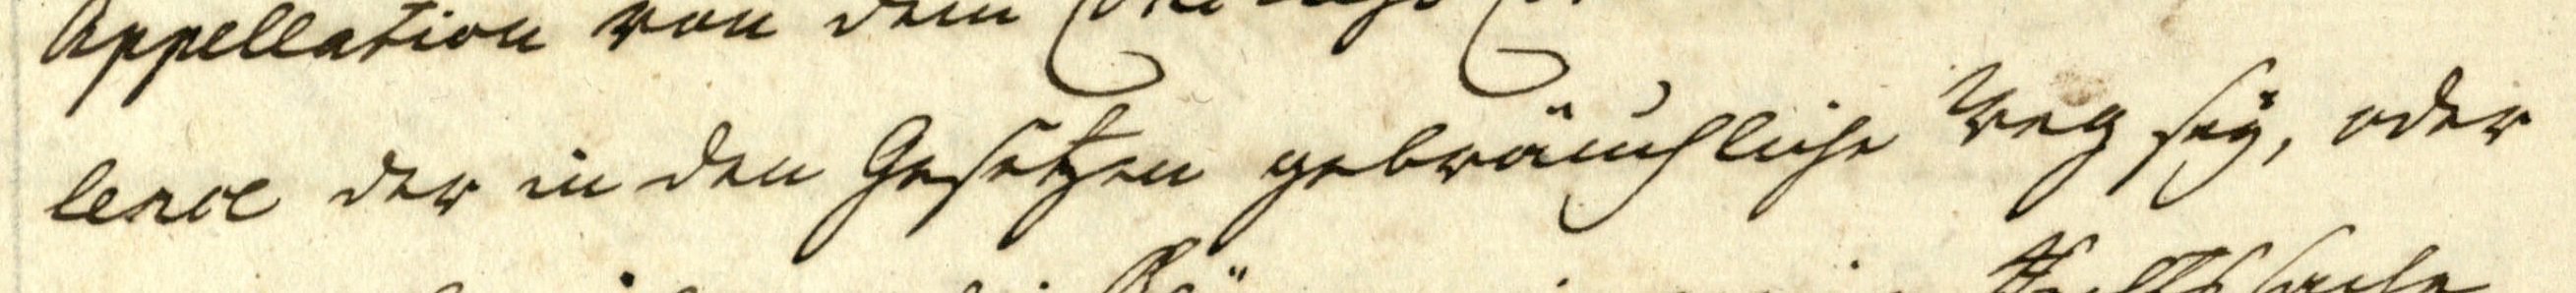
lence der in den Gesetzen gebräuchliche Weg seÿ, oder
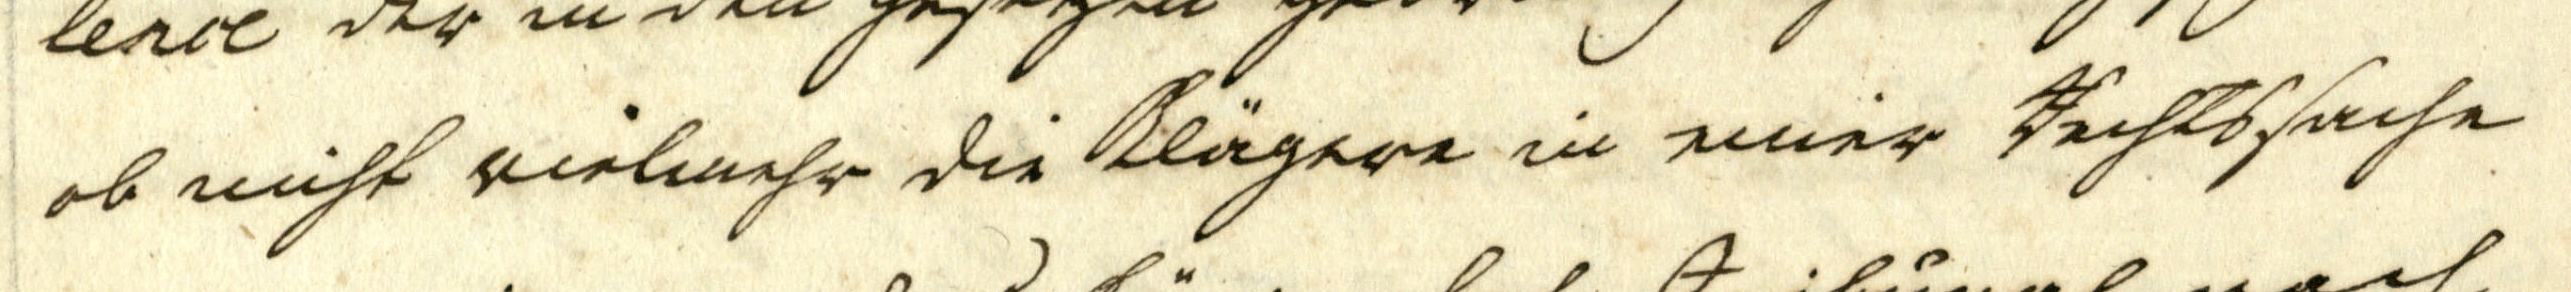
ob nicht vielmehr die Klägere in einer Rechtssache
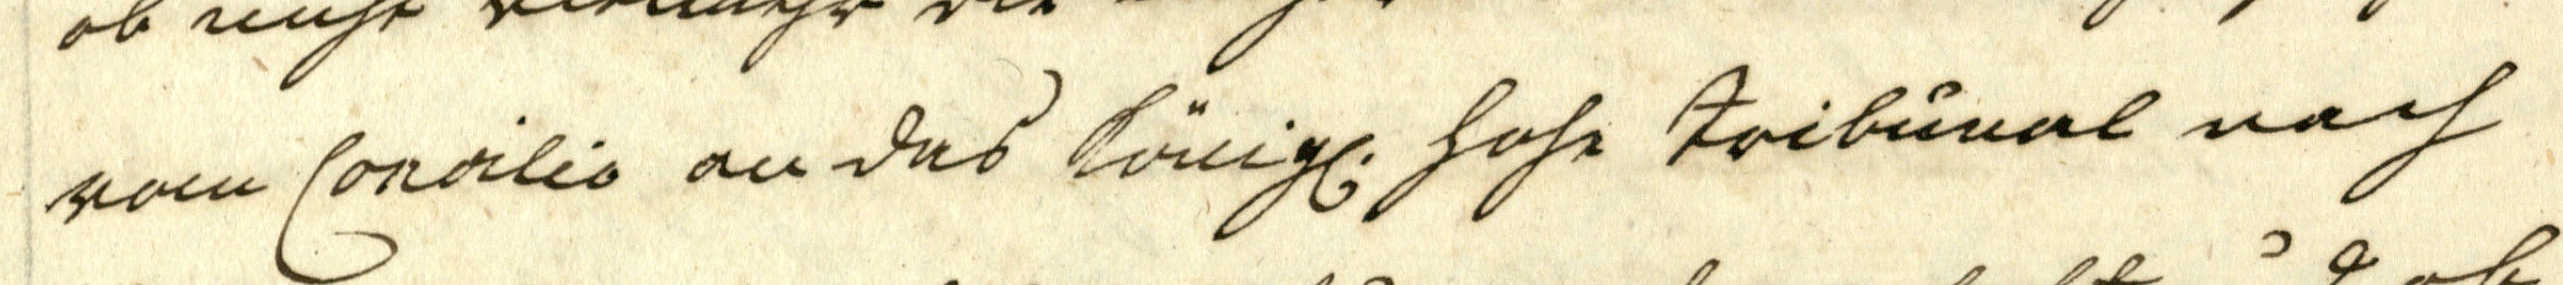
vom Concilio an das Königl. Hohe Tribunal nach
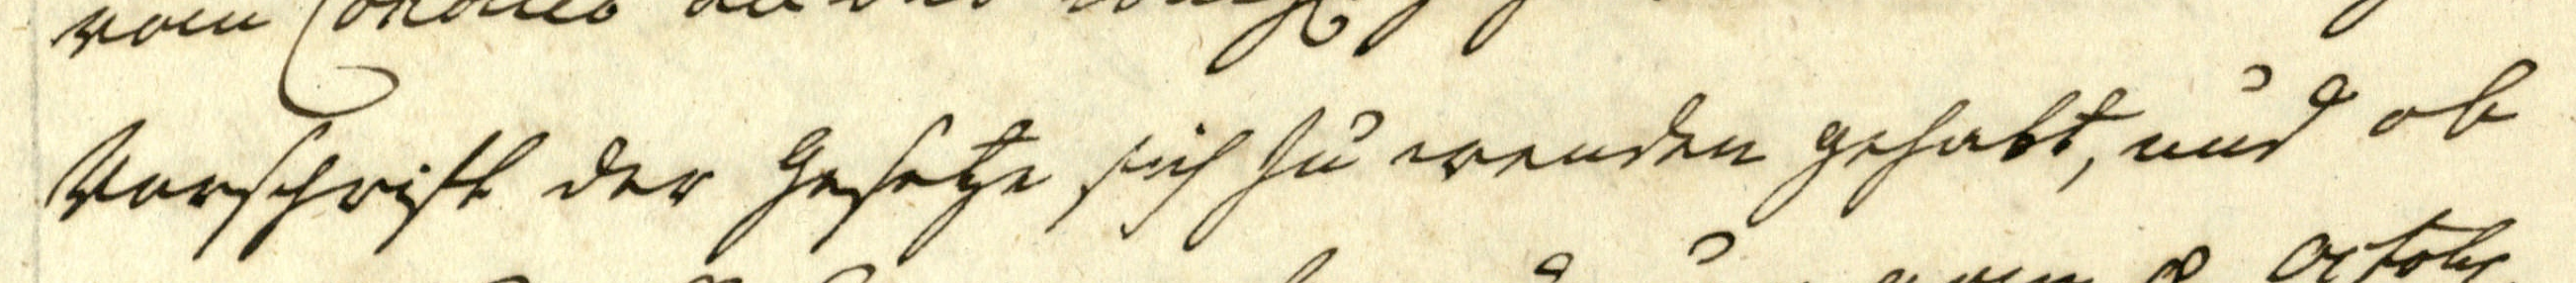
Vorschrift der Gesetze sich zu wenden gehabt, und ob
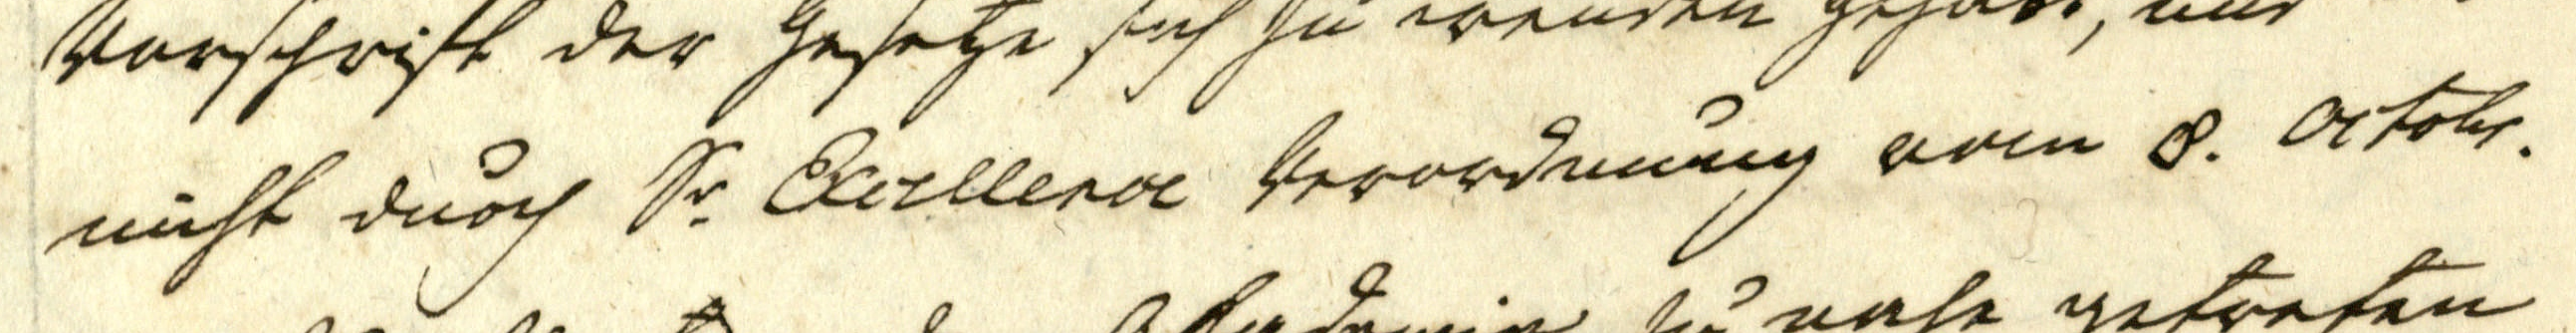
nicht durch Sr Excellence Verordnung vom 8. Octobr.
